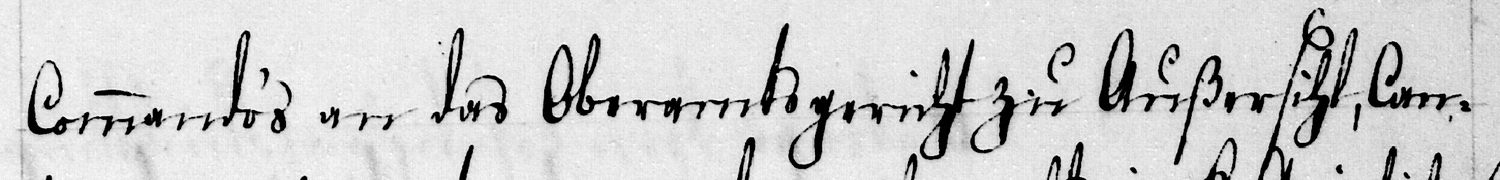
Commando’s an das Oberamtsgericht zu Außersihl, Can¬
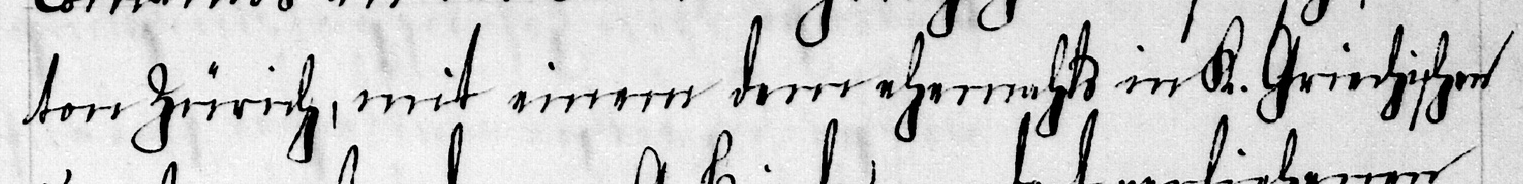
ton Zürich, mit einem dem ehemahls in K. Griechischen
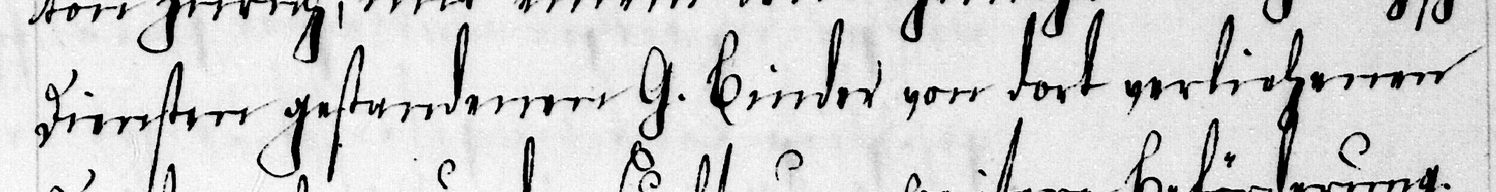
Diensten gestandenen G. Binder von dort verliehenen
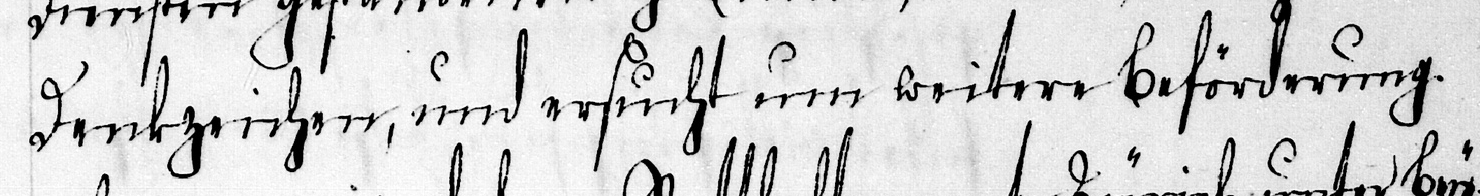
Denkzeichen, und ersucht um weitere Beförderung.
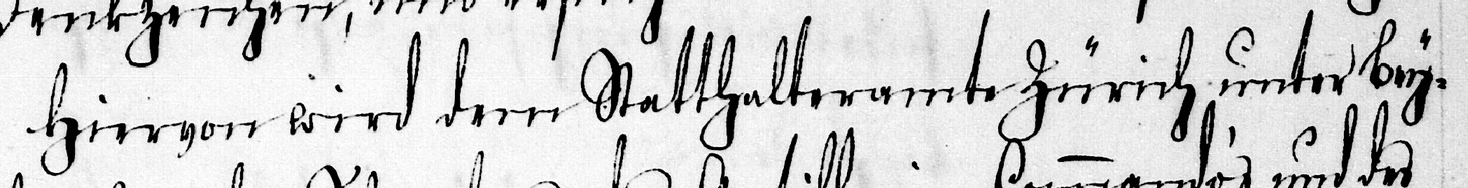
Hiervon wird dem Statthalteramte Zürich unter Bey¬
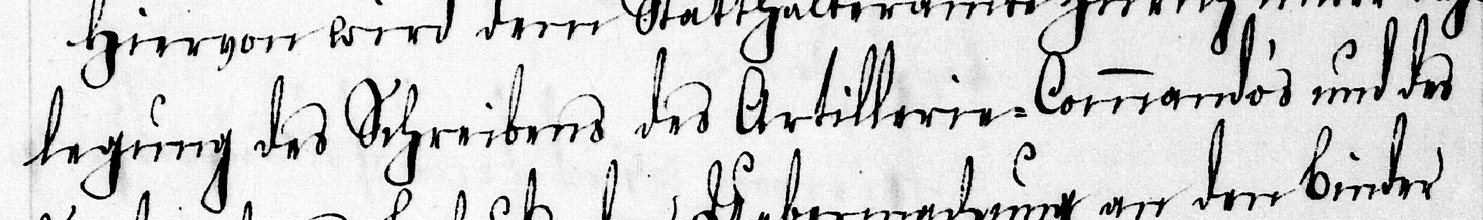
legung des Schreibens des Artillerie-Commando’s und des
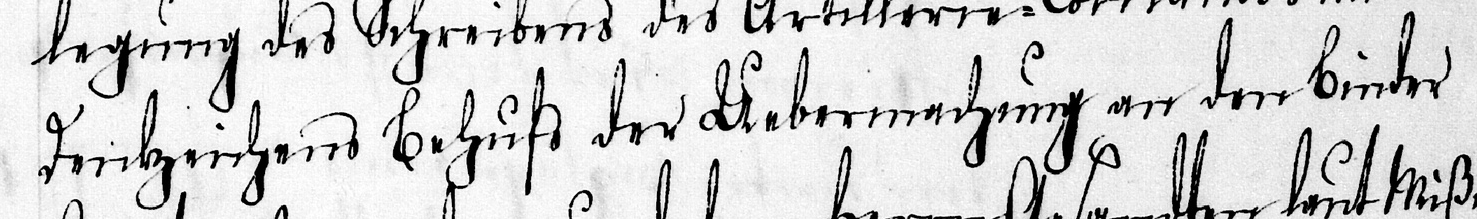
Denkzeichens Behufs der Uebermachung an den Binder
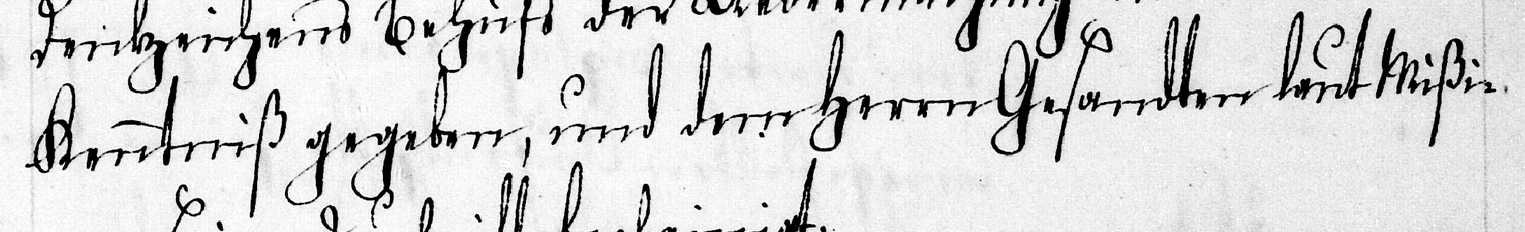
Kenntniß gegeben, und dem Herrn Gesandten laut Mißi¬
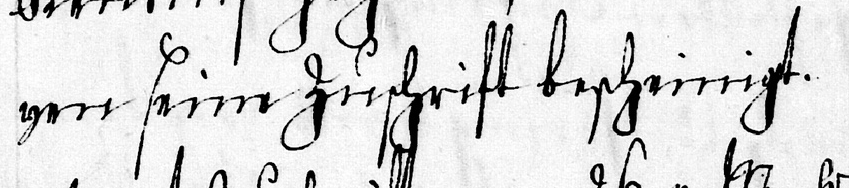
ven seine Zuschrift bescheinigt.
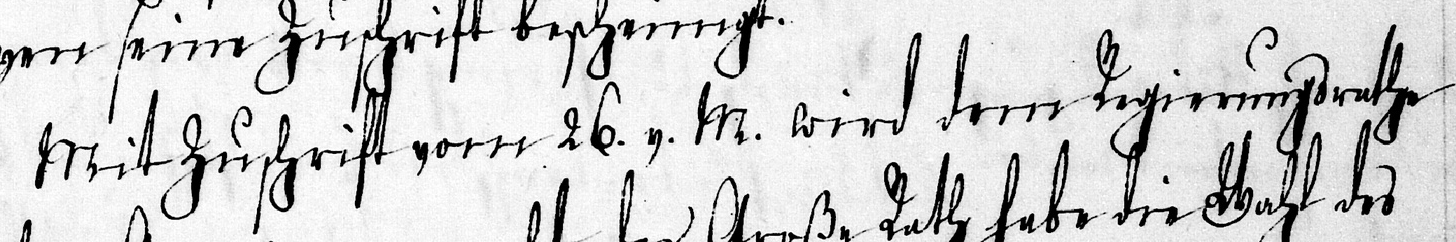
Mit Zuschrift vom 26. v. M. wird dem Regierungsrathe
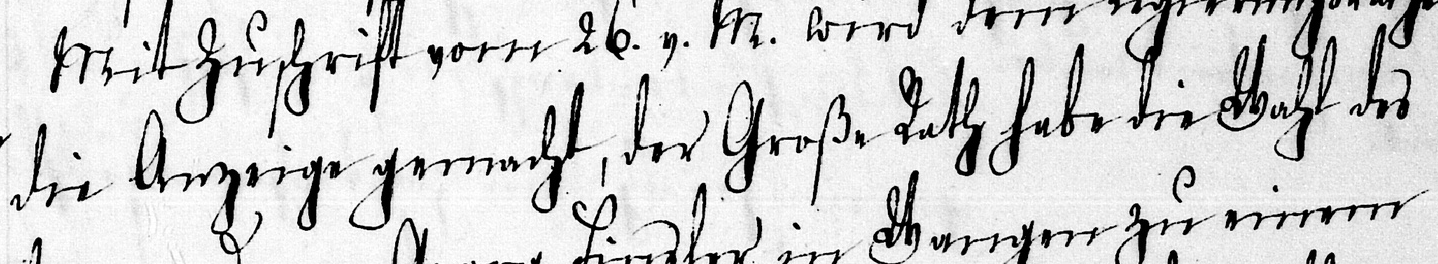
die Anzeige gemacht, der Große Rath habe die Wahl des
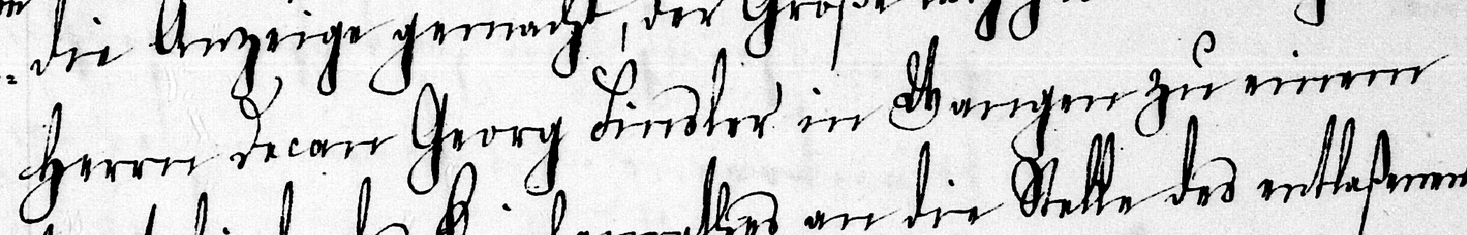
Herrn Decan Georg Finsler in Wangen zu einem
